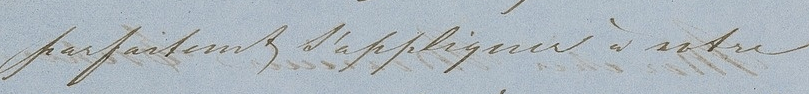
parfaitemt s'appliquer à notre
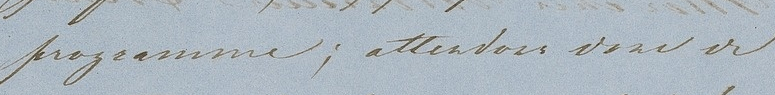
programme; attendons donc de
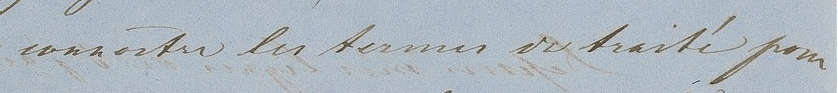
connaître les termes du traité pour
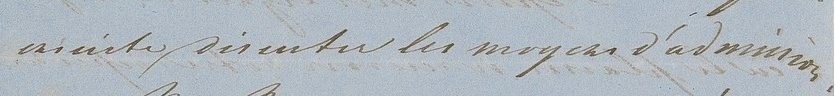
ensuite discuter les moyens d'admission.
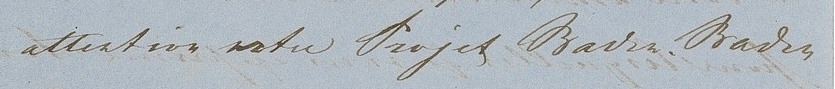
attention votre Projet Baden-Baden
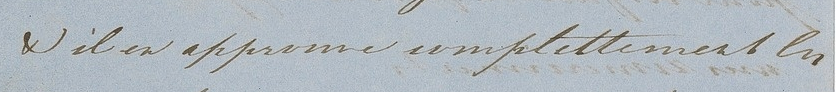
& il en approuve complettement les
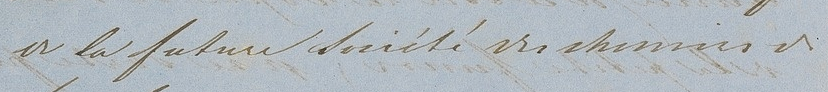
de la future Société des chemins de
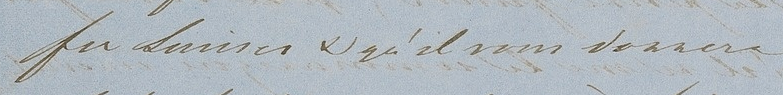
fer Suisses & qu'il vous donnera
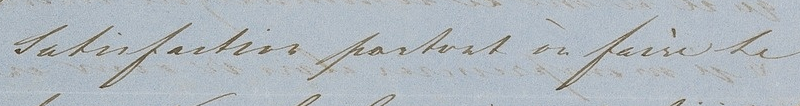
satisfaction partout où faire le
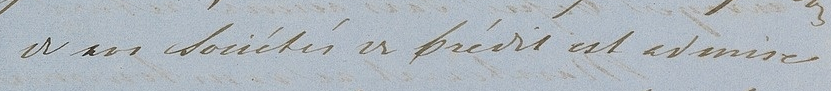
de nos Sociétés de Crédit est admise
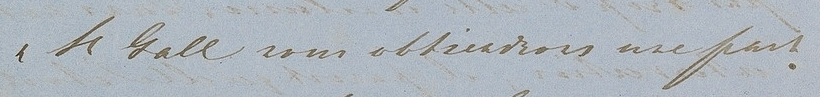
& St Gall nous obtiendrons une part
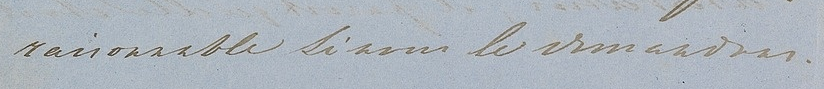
raisonnable si nous le demandons.
